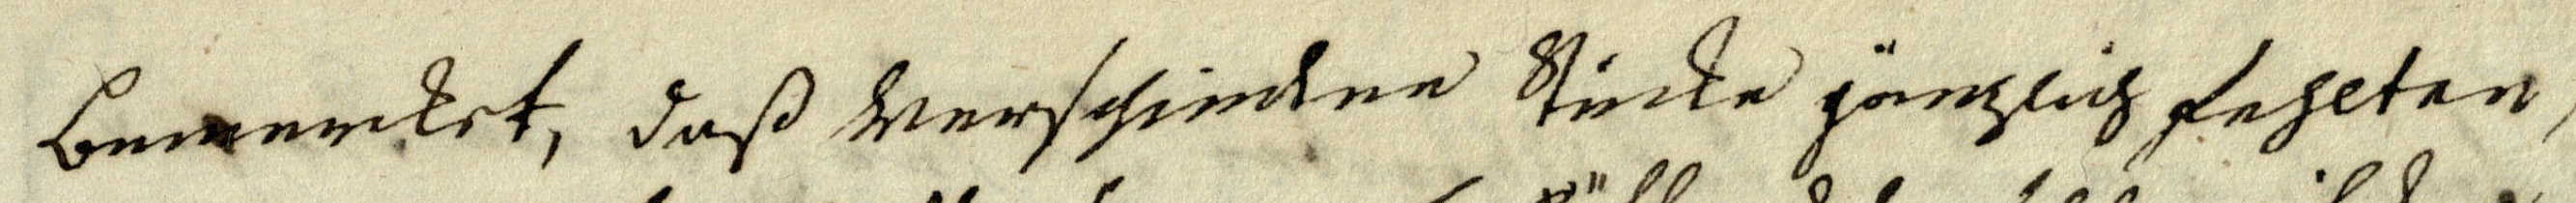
bemercket, daß verschiedene Stücke gänzlich fehlten,
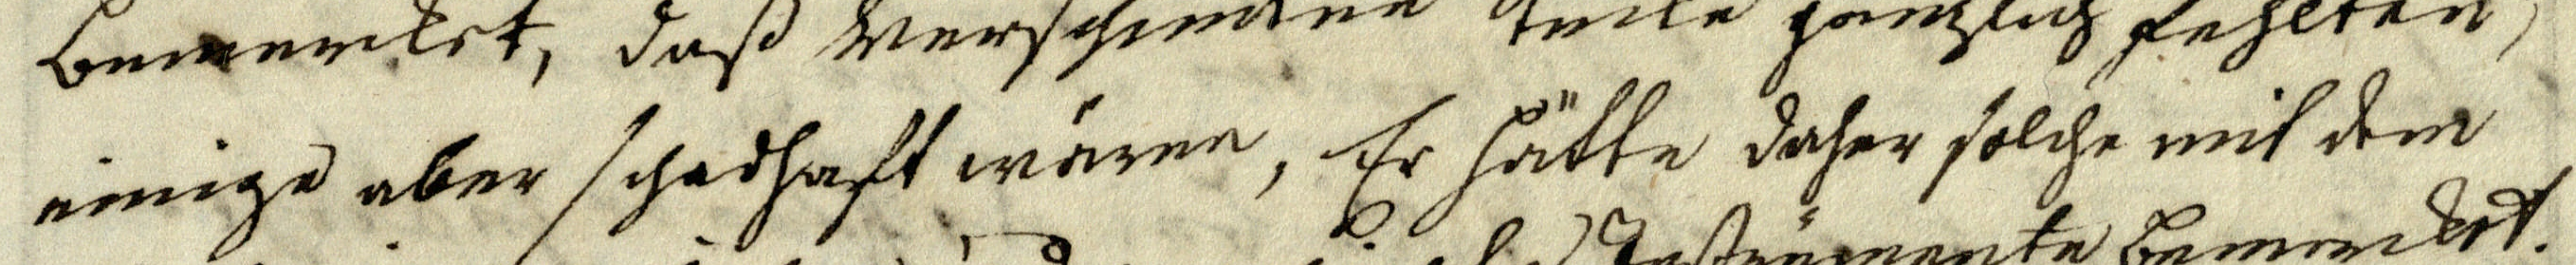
einige aber schadhaft wären, Er hätte daher solche mit dem
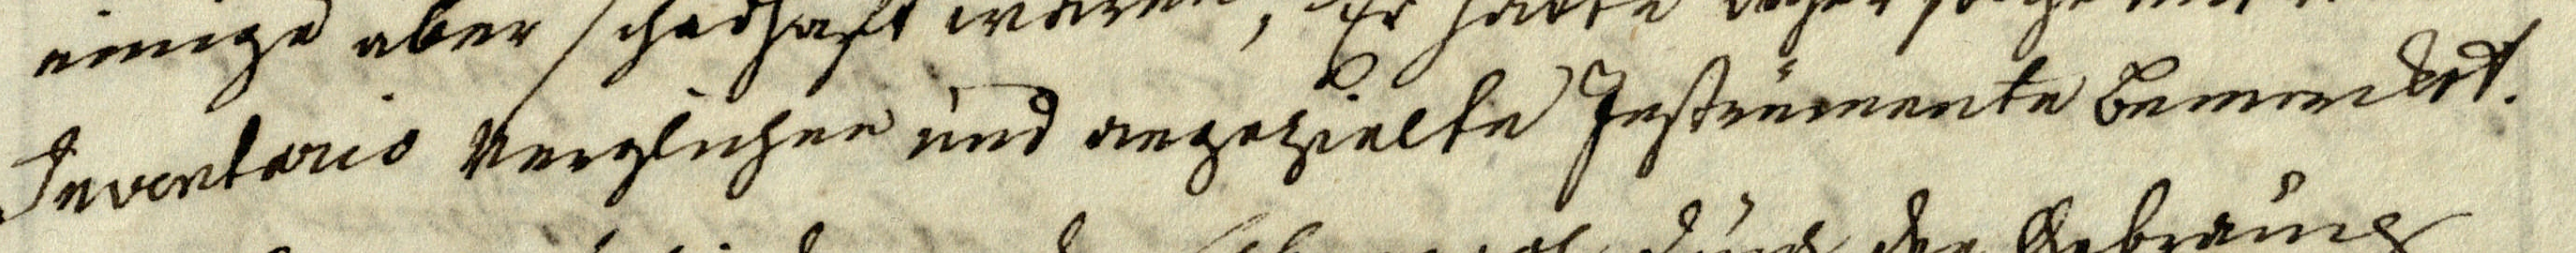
Inventario verglichen und angezielte Instrumente bemercket.
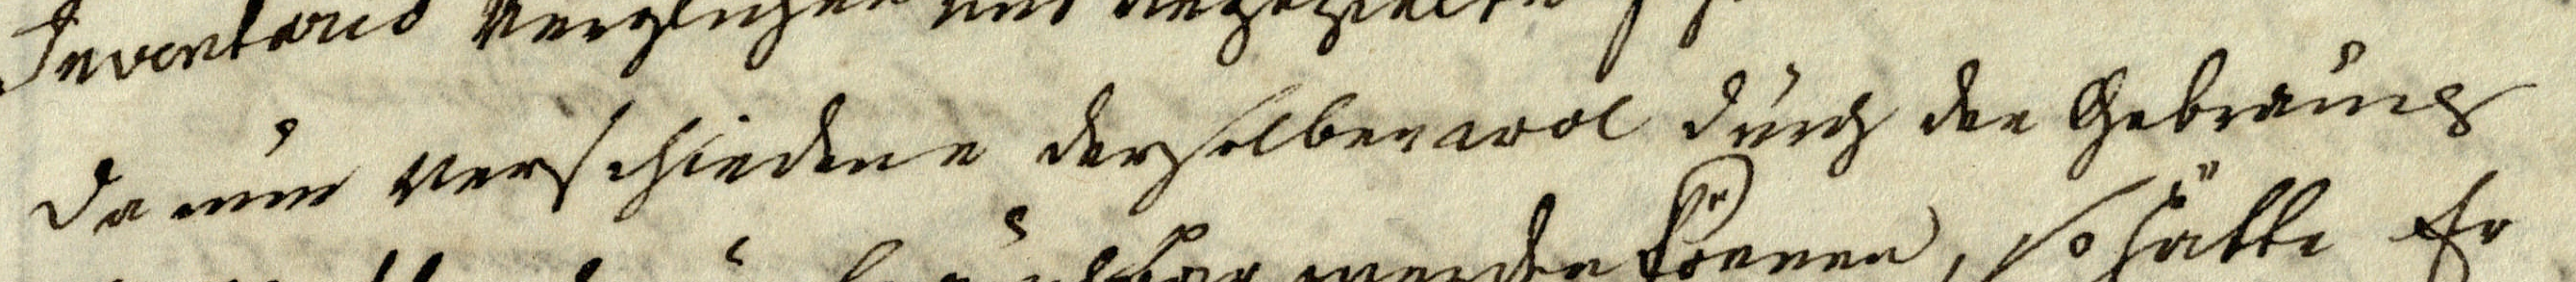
da nun verschiedene derselben wol durch den Gebrauch
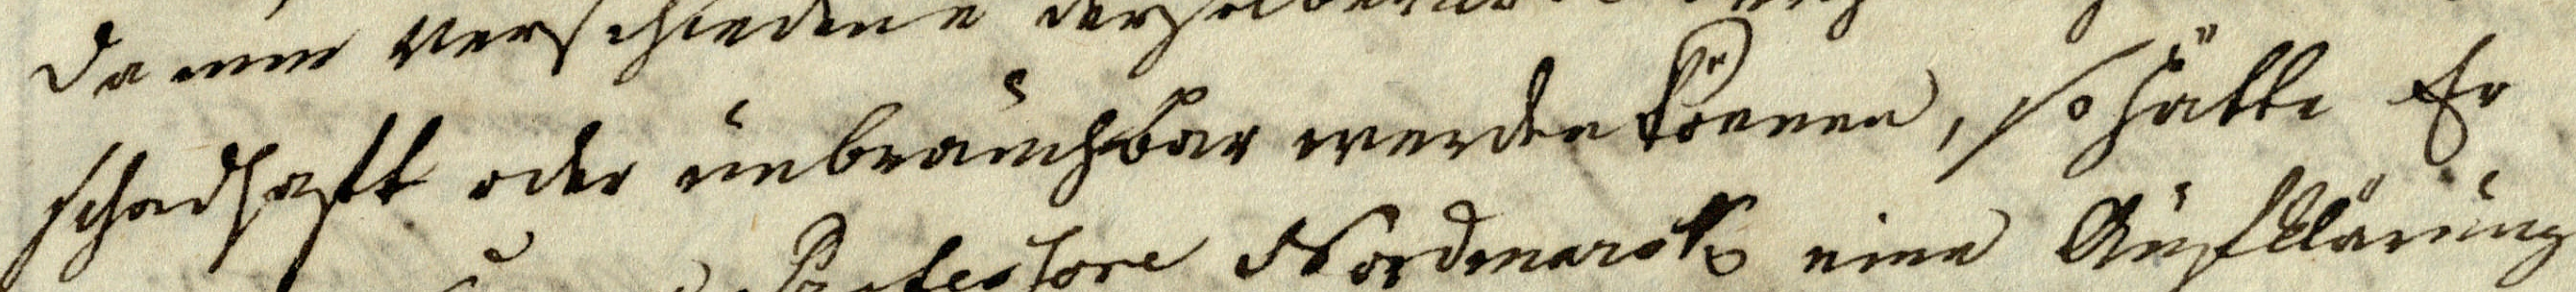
schadhaft oder unbrauchbar werden können, so hätte Er
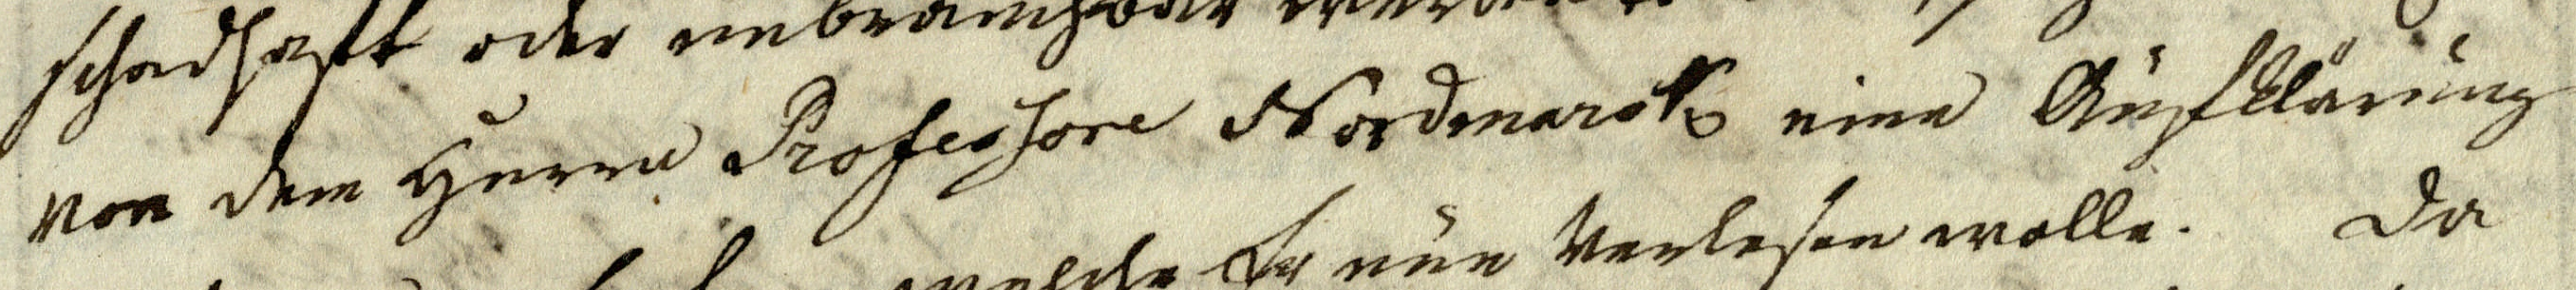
von dem Herrn Professor Nordmarck eine Aufklärung
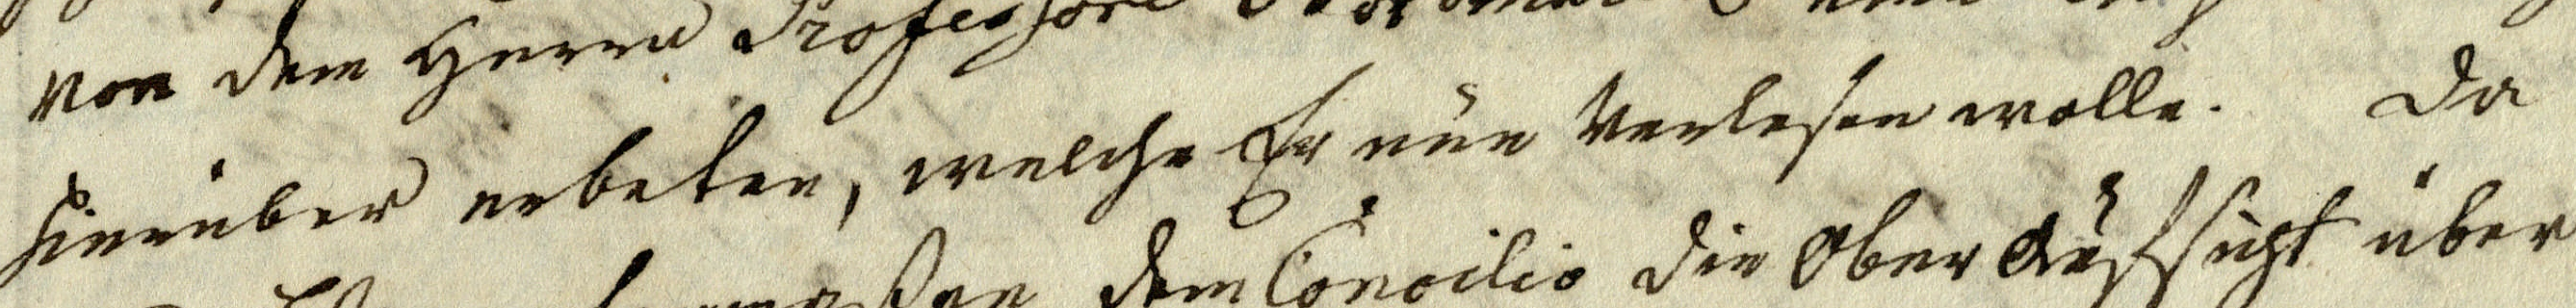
hierüber erbeten, welche Er nun verlesen wolle. Da
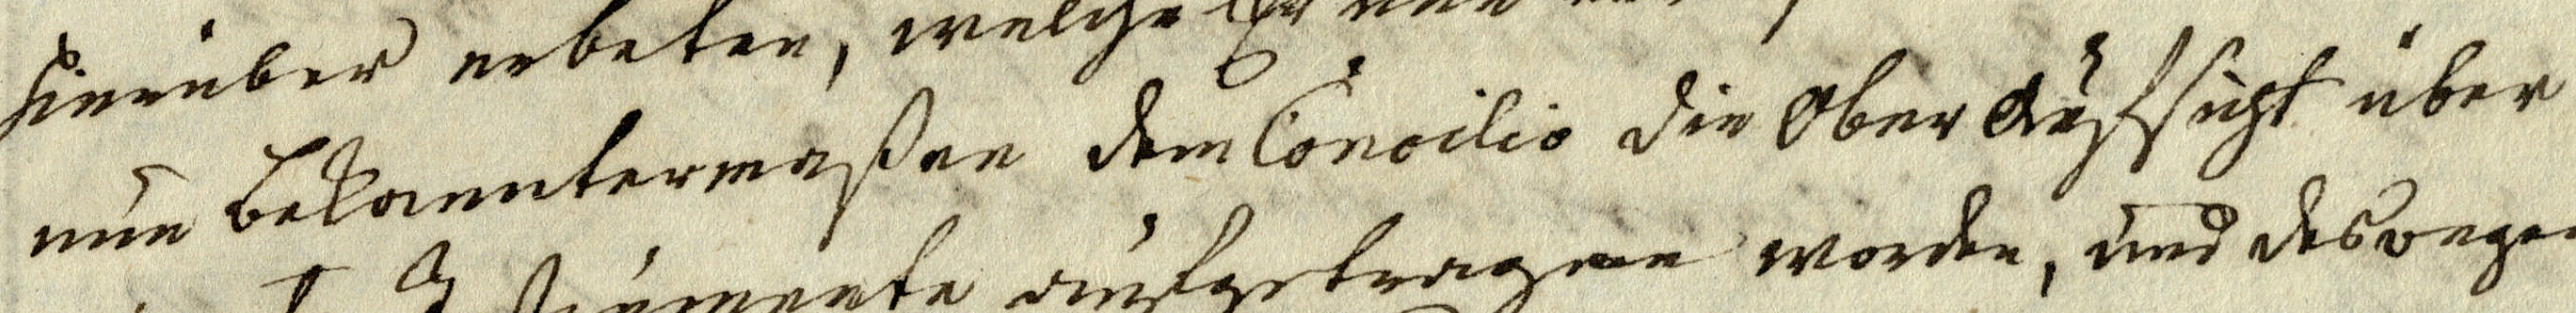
nun bekanntermaßen dem Concilio die Ober Aufsicht über
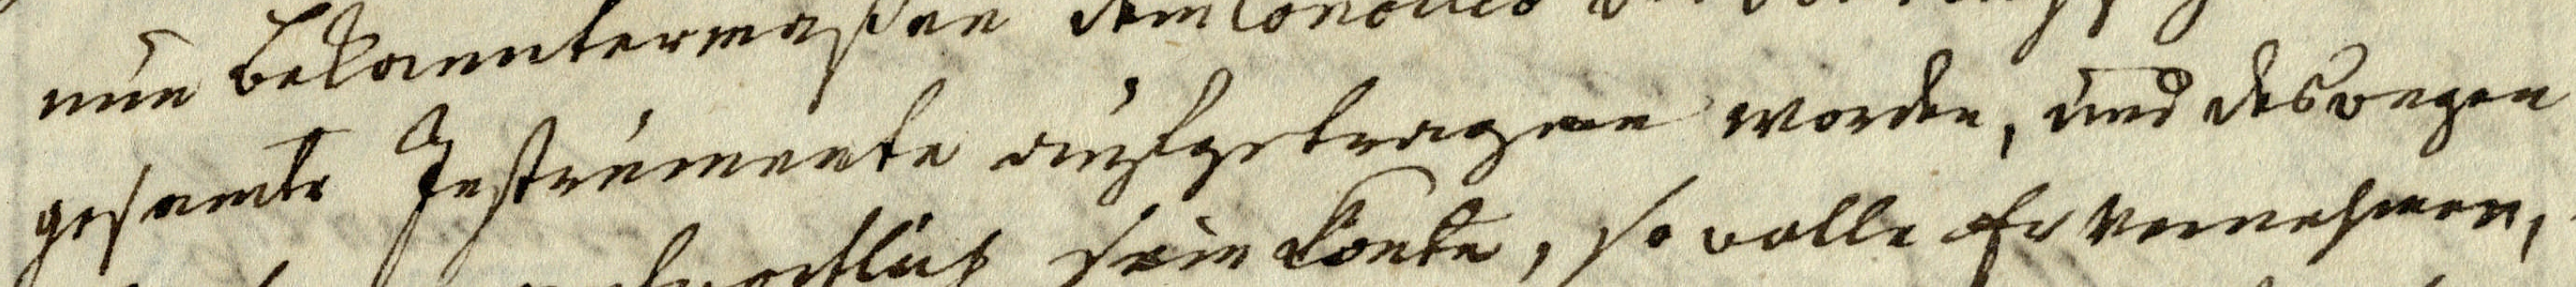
gesamte Instrumente aufgetragen worden, und deswegen
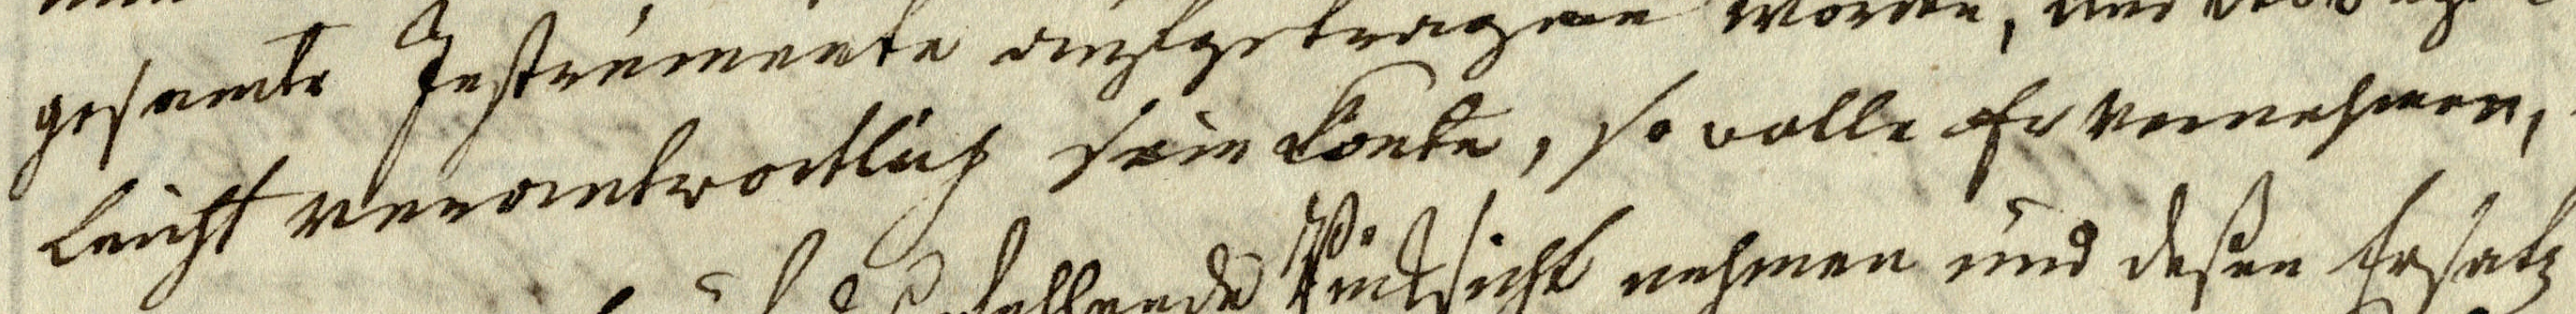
leicht verantwortlich sein könte, so wolle Er vernehmen,
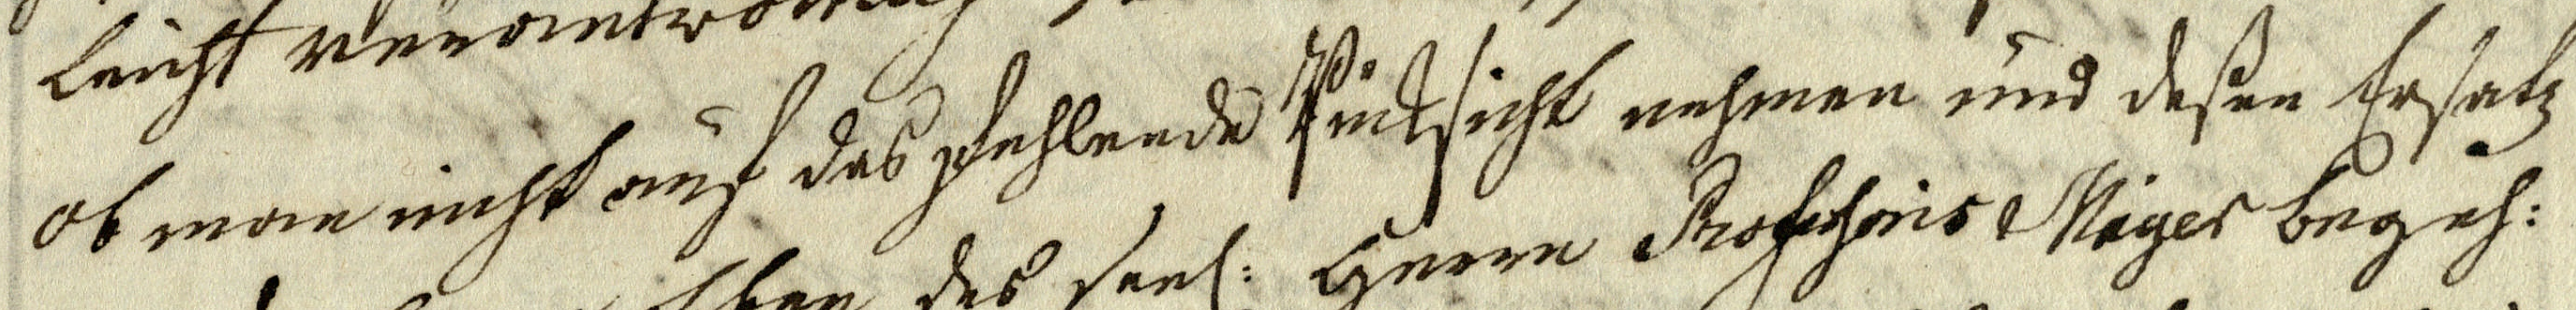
ob man nicht auf das fehlende Rücksicht nehmen und deßen Ersatz
